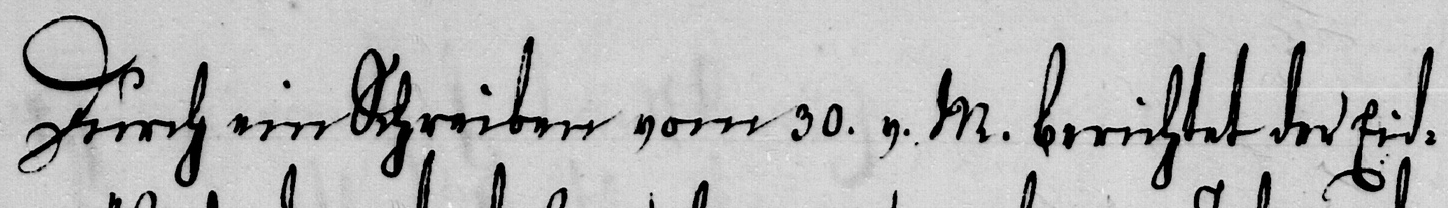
Durch ein Schreiben vom 30. v. M. berichtet der Eid¬
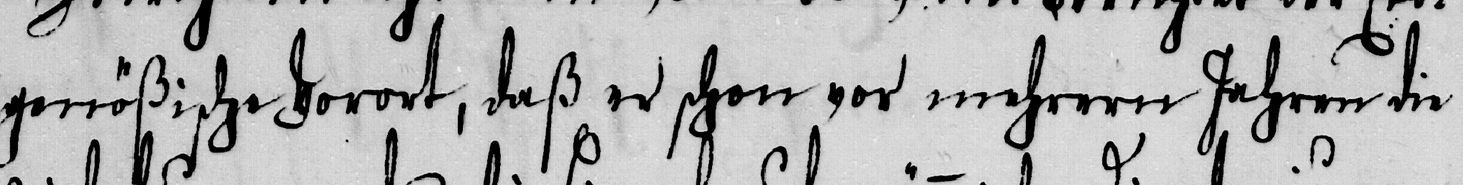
genößische Vorort, daß er schon vor mehrern Jahren die
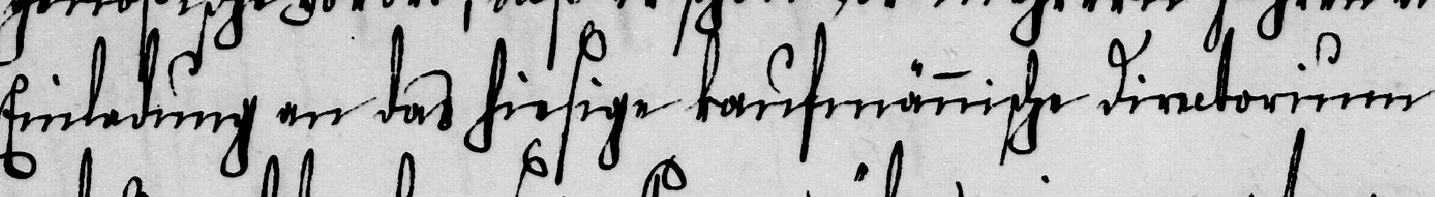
Einladung an das hiesige kaufmännische Directorium
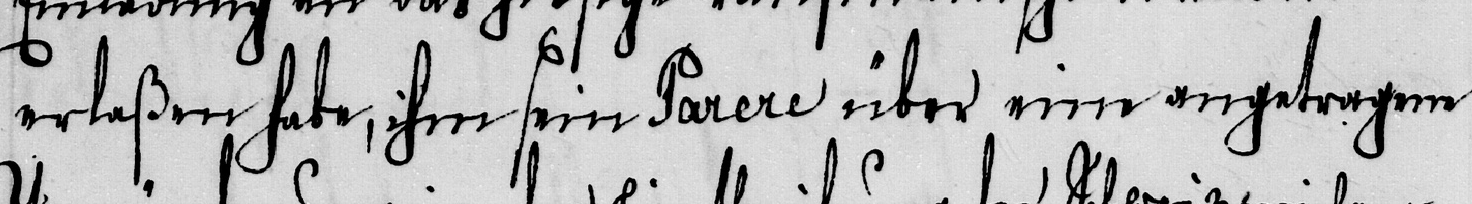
erlaßen habe, ihm sei Parere über über eine angetragene
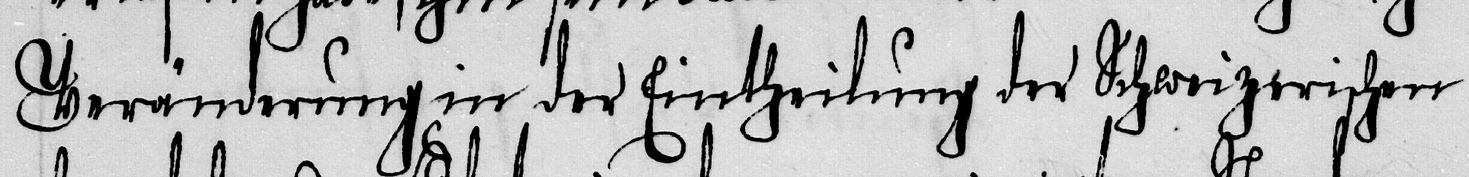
Veränderung in der Eintheilung der Schweizerischen
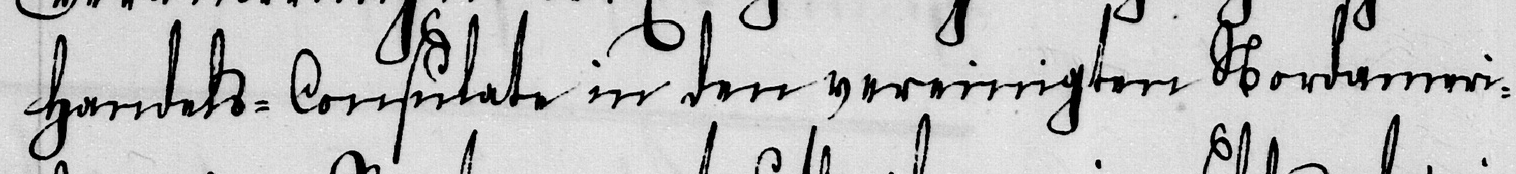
Handels-Consulate in den vereinigten Nordameri¬
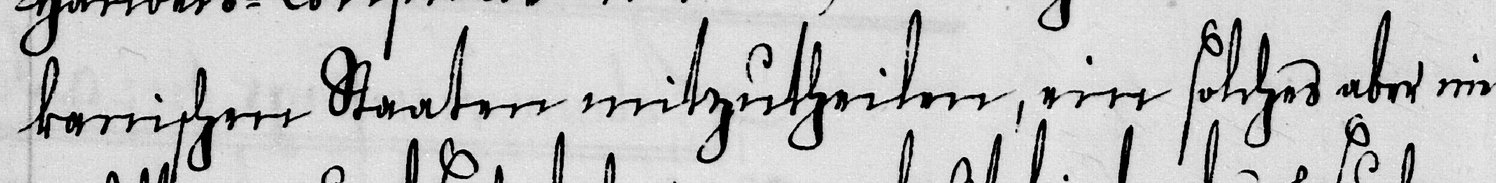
kanischen Staaten mitzutheilen, ein solches aber nie
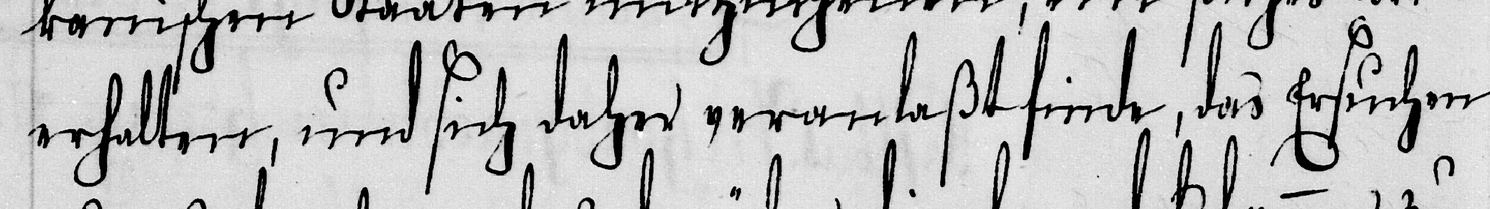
erhalten, und sich daher veranlaßt finde, das Ersuchen
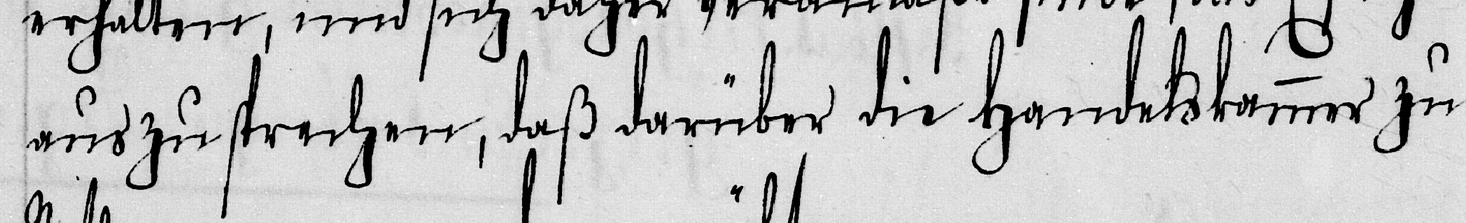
auszusprechen, daß darüber die Handelskammer zu
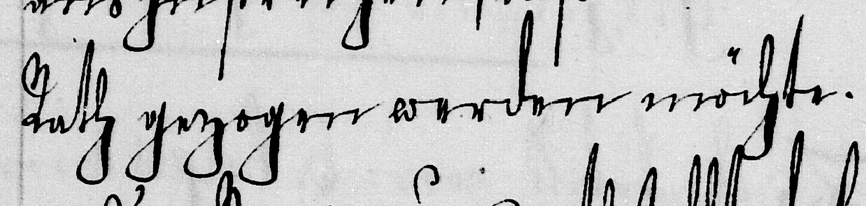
Rath gezogen werden möchte.
